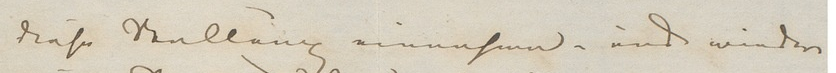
diese Stellung einnehme – und wieder
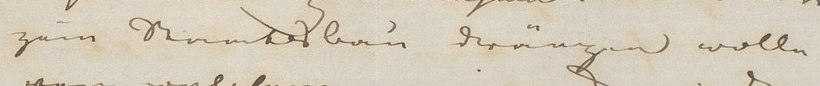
zum Staatsbau drängen wolle
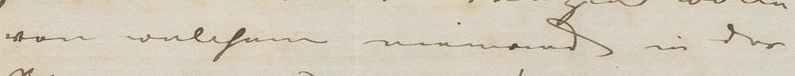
von welchem niemand in der
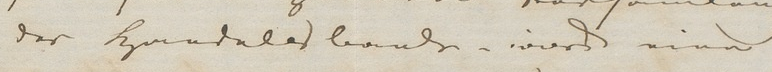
der Handelsbank – wird eine
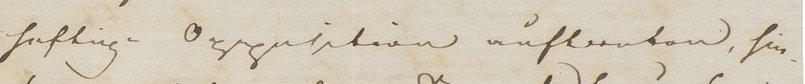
heftige Opposition auftreten, hin-
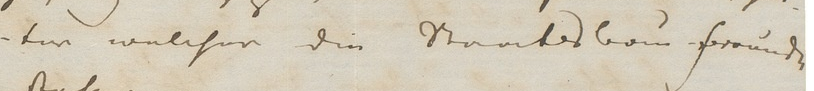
ter welcher die Staatsbau-Freunde
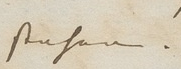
stehen.
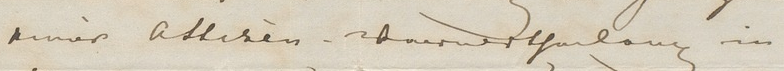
einer Attisen-Verurtheilung in
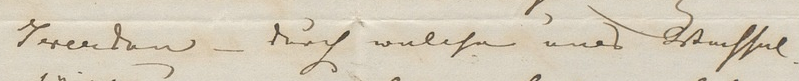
Jverdon durch welche uns Wechsel-
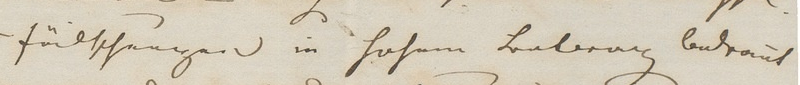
Fälschungen in hohem Betrag bekannt
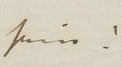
sein!
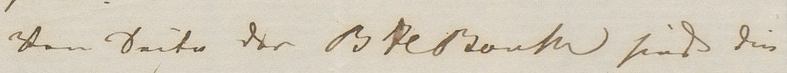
Von Seite der BHBank sind die
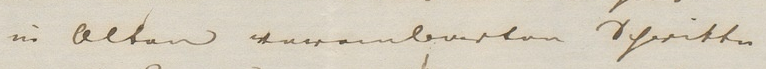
in Olten vereinbarten Schritte
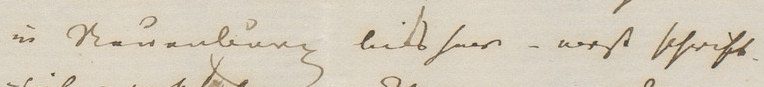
in Neuenburg bisher – erst schrift-
